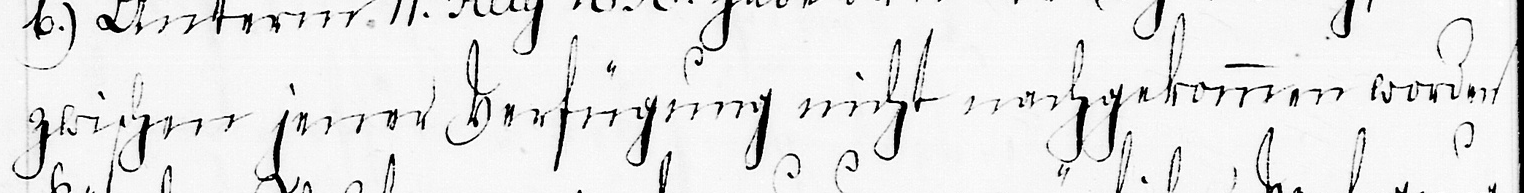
zwischen jener Verfügung nicht nachgekommen worden
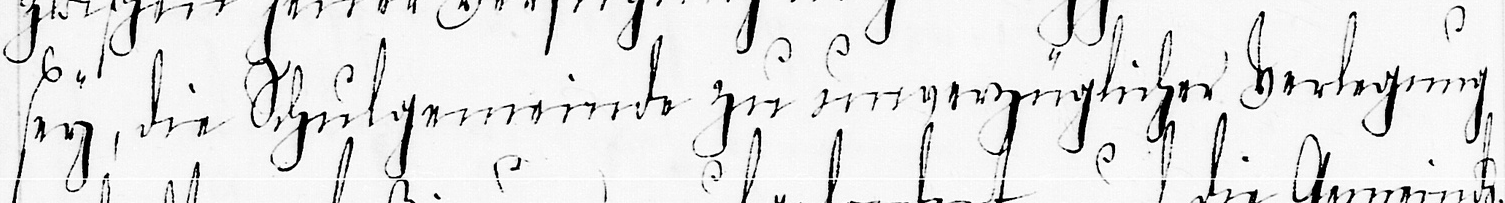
sey, die Schulgemeinde zu unverzüglicher Verlegung
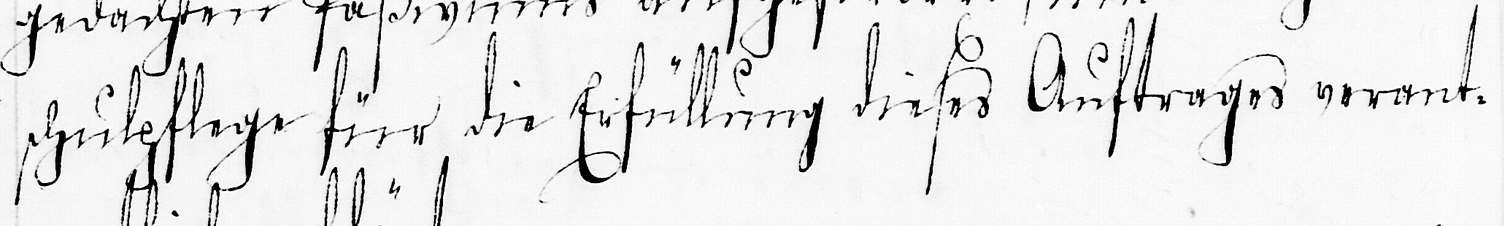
schulpflege für die Erfüllung dieses Auftrages verant¬
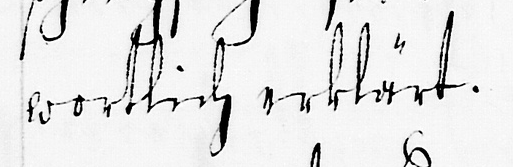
wortlich erklärt.
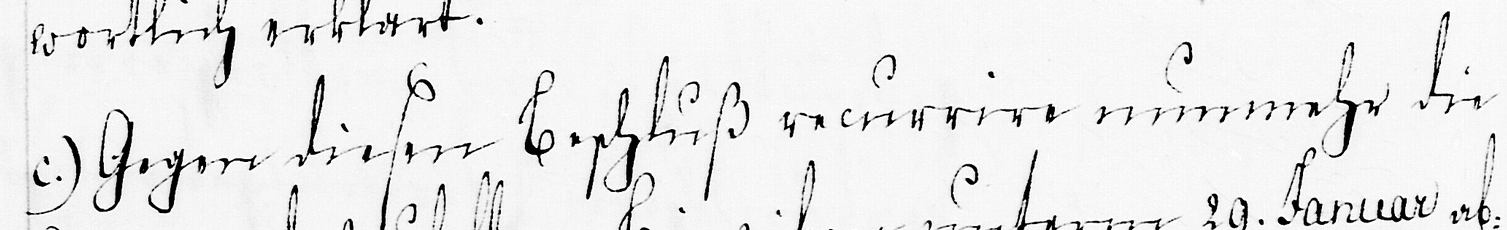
c.) Gegen diesen Beschluß recurrire nunmehr die
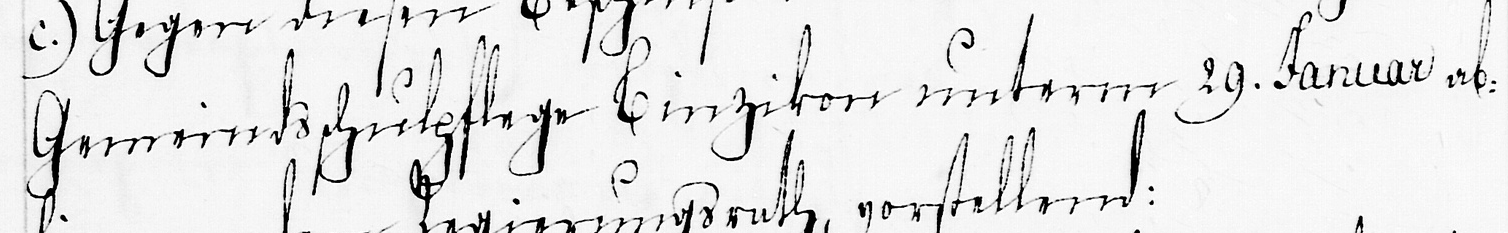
Gemeindsschulpflege Binzikon unterm 29. Januar ab¬
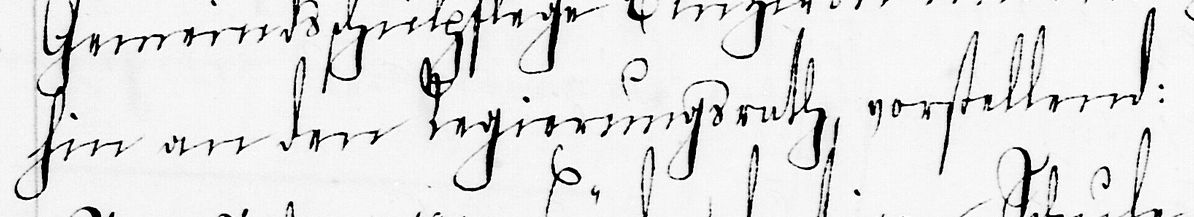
hin an den Regierungsrath, vorstellend:
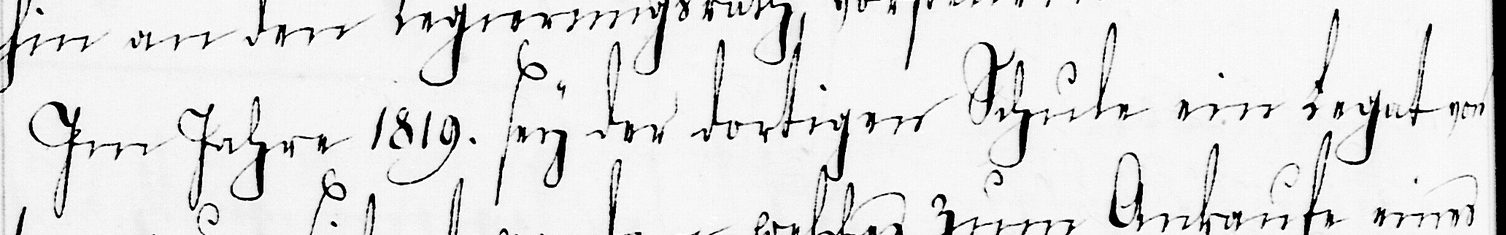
Im Jahre 1819. sey der dortigen Schule ein Legat v¬
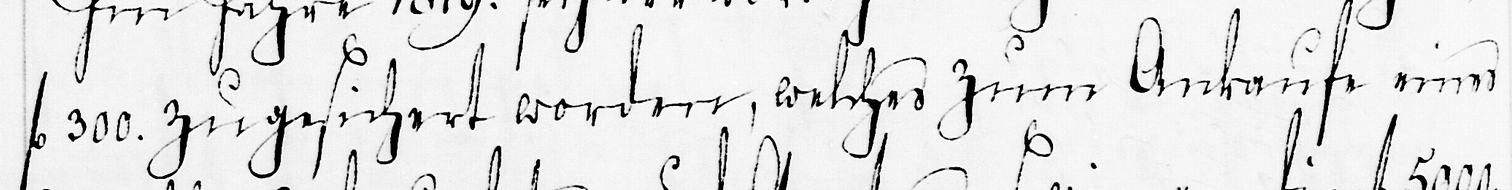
l. 300. zugesichert worden, welches zum Ankaufe eines
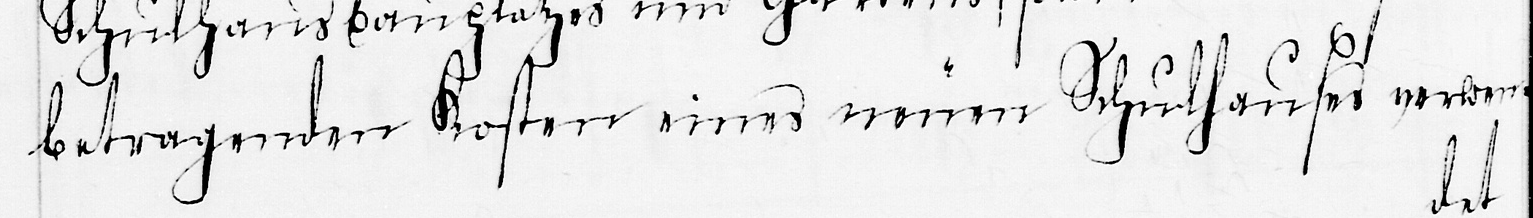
betragenden Kosten eines neuen Schulhauses verwe¬
